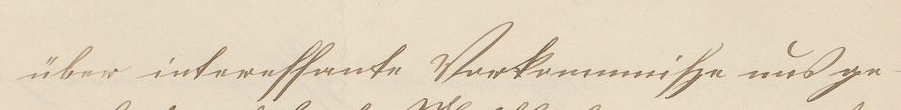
über interessante Vorkommnisze uns ge-
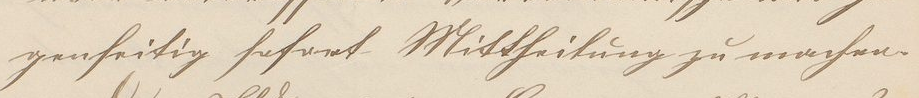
genseitig sofort Mittheilung zu machen.
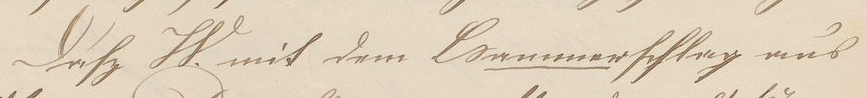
Dasz W mit dem Hammerschlag an's
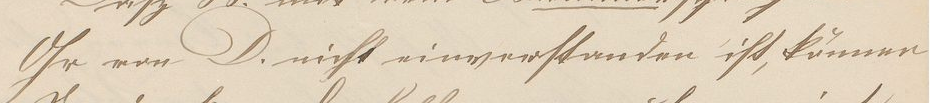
Ohr von D. nicht einverstanden ist, können
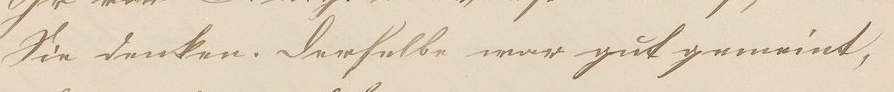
Sie denken. Derselbe war gut gemeint,
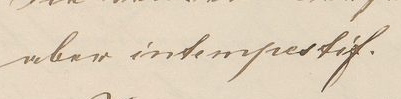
aber intempestif.
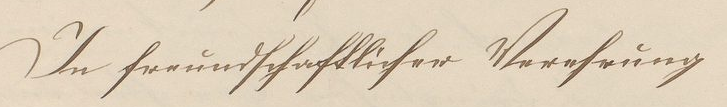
In freundschaftlicher Verehrung
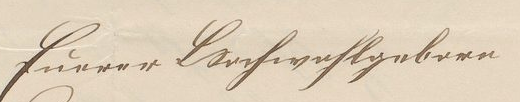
Euerer Hochwohlgeborn
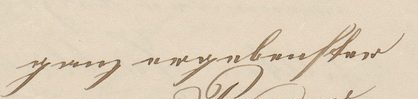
ganz ergebenster
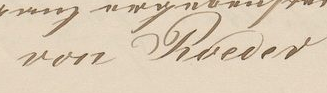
von Roeder
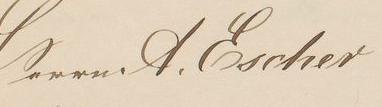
Herrn A. Escher
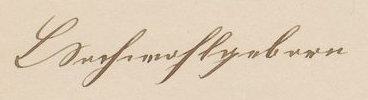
Hochwohlgeborn
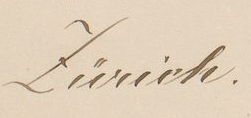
Zürich.
